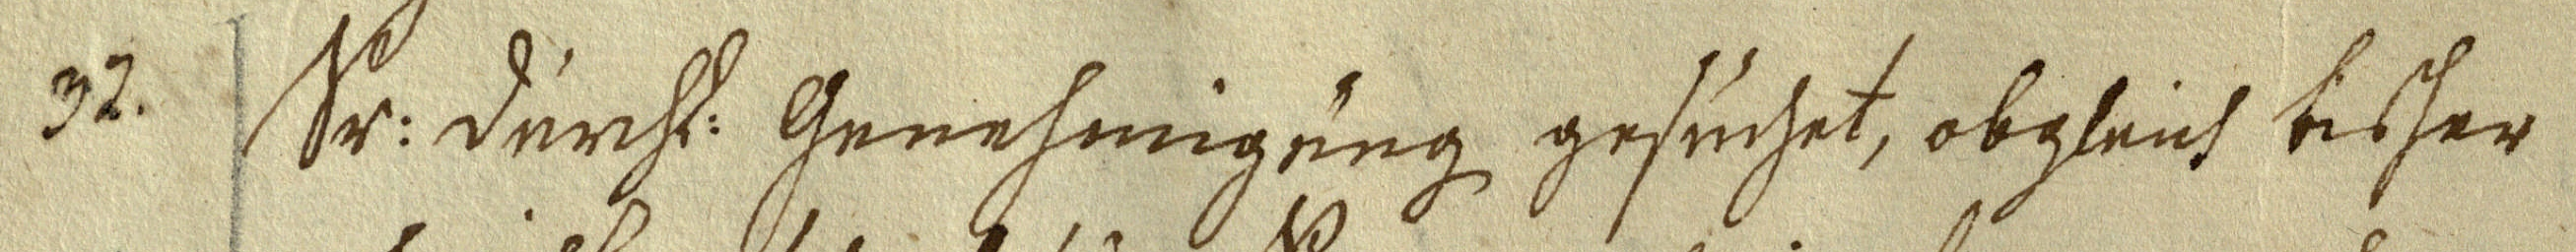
Sr Durchl. Genehmigung gesuchet, obgleich bisher
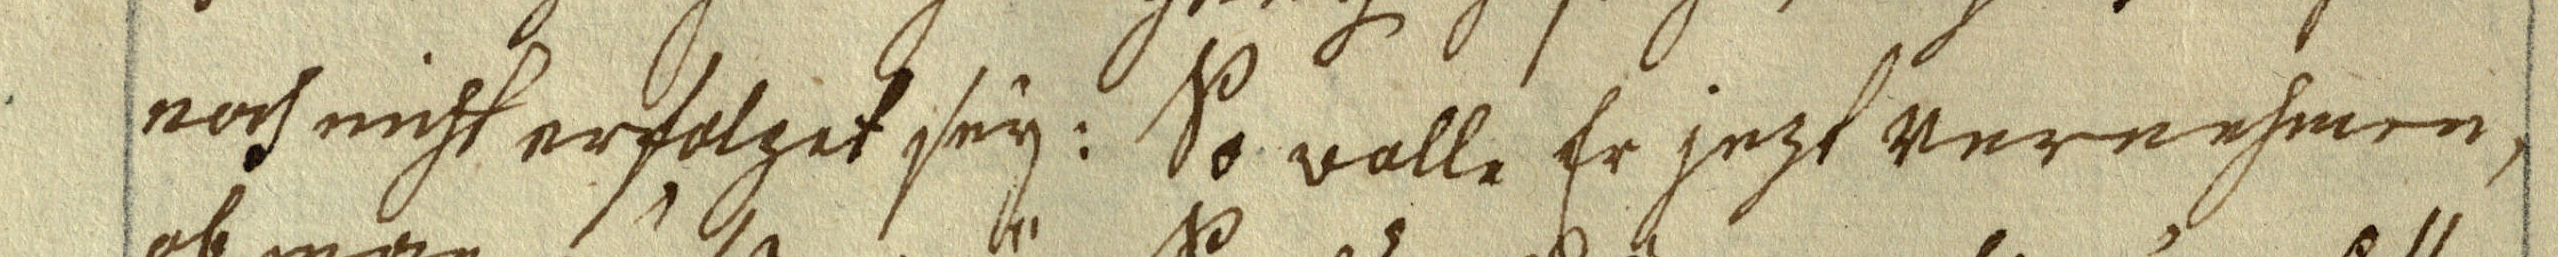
noch nicht erfolget seÿ: So wolle Er jezt vernehmen,
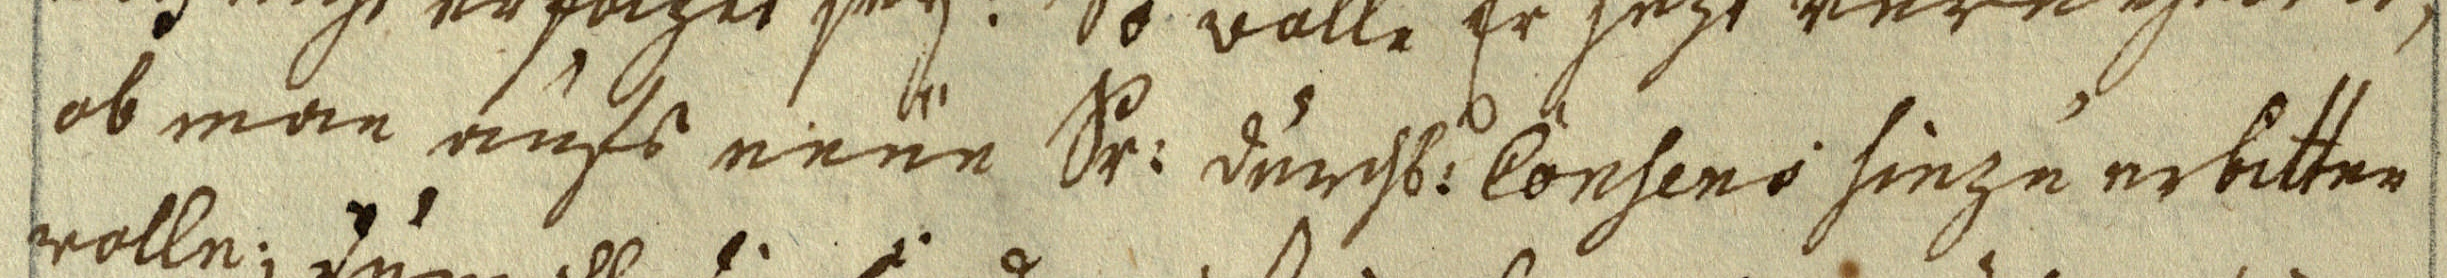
ob man aufs neue Sr Durchl. Consens hiezu erbitten
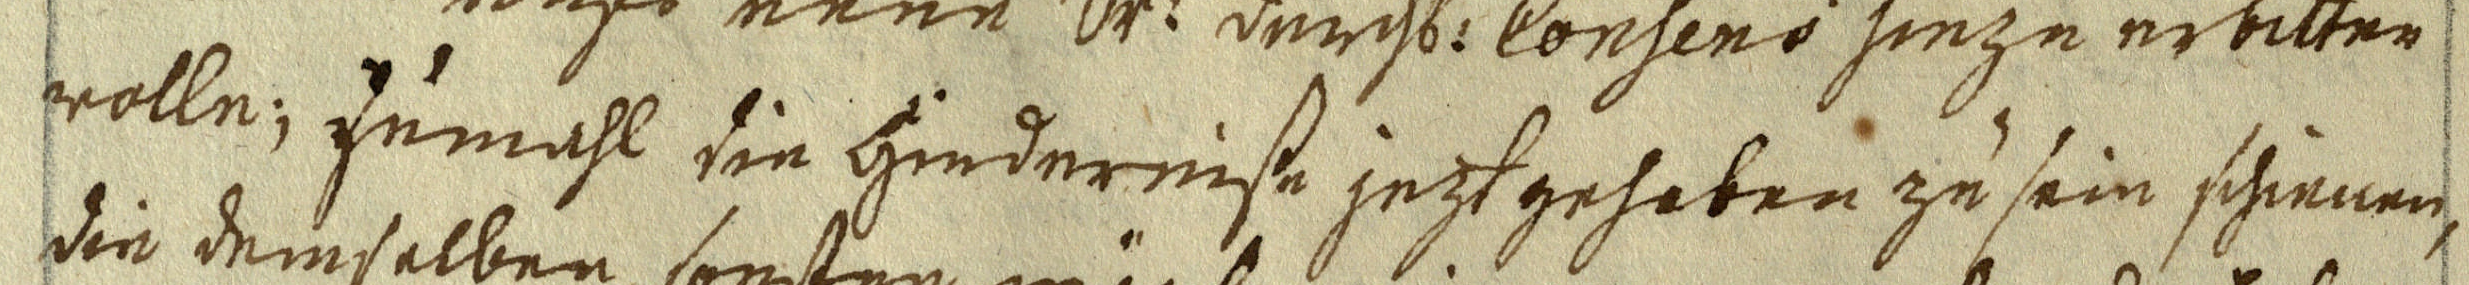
wolle; zumahl die Hinderniße jezt gehoben zu sein schienen,
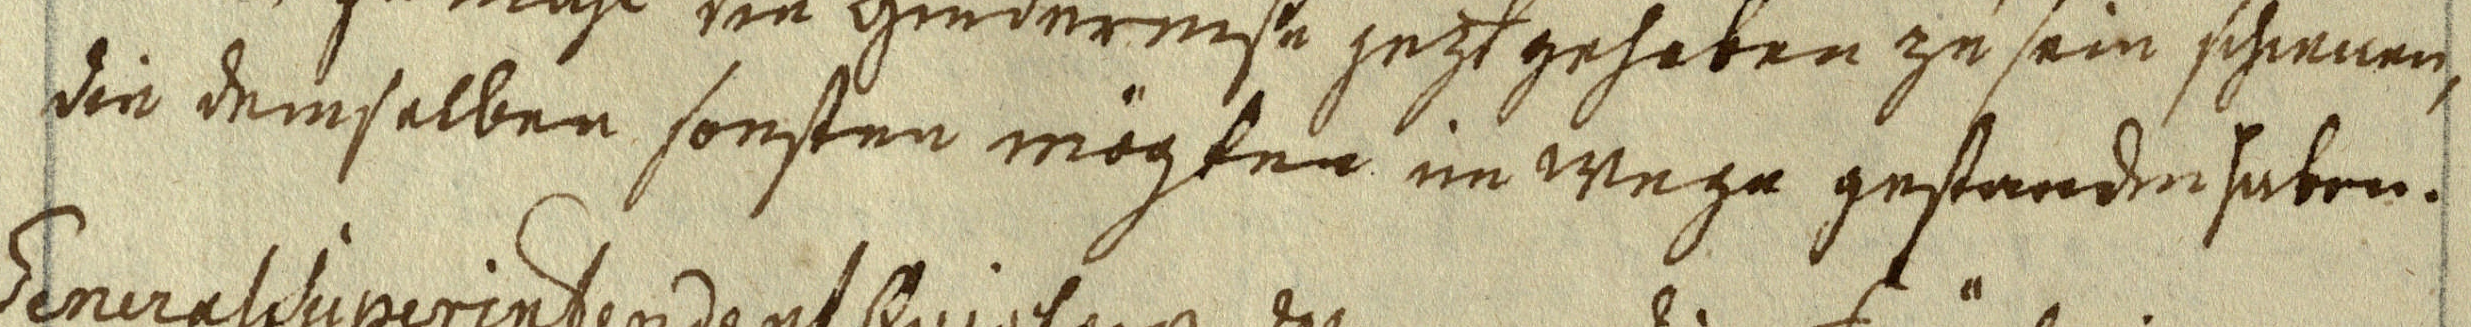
die demselben sonsten mögten im Wege gestanden haben.
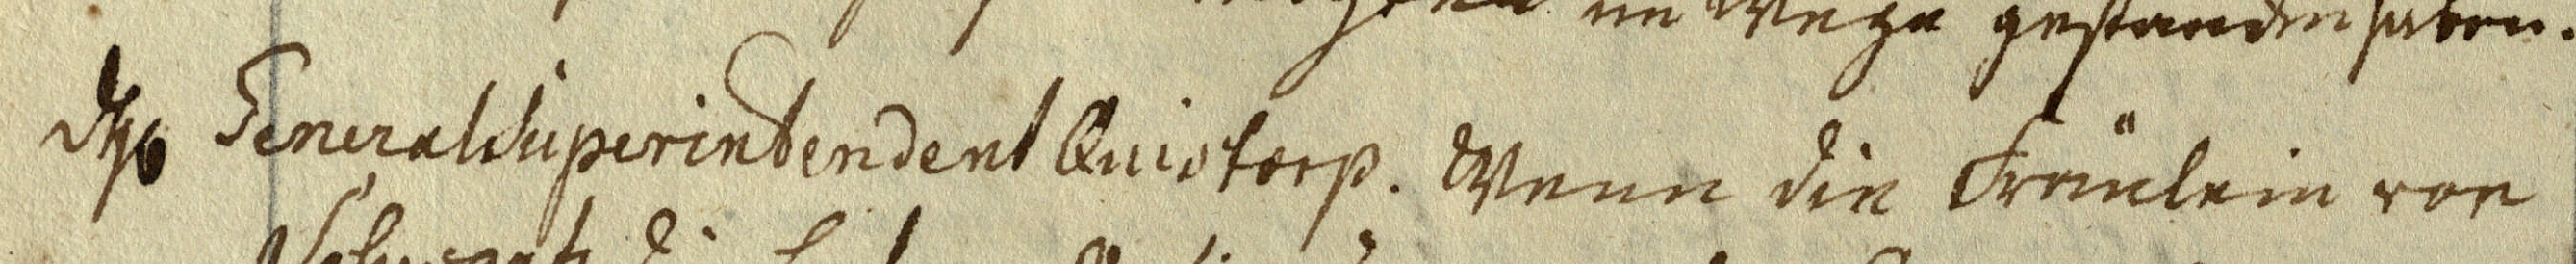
dh GeneralSuperintendent Quistorp. Wenn die Fräulein von
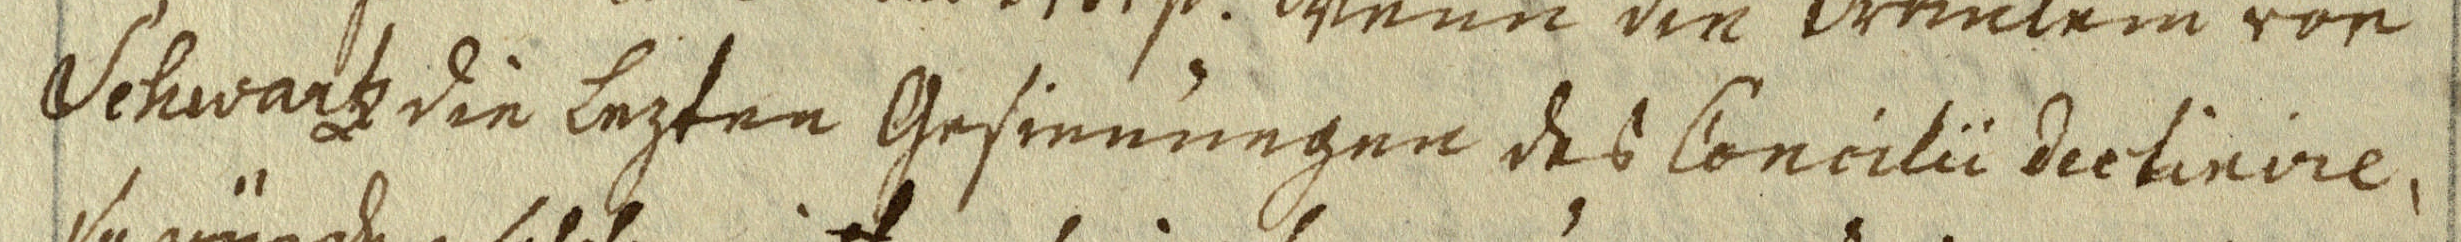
Schwartz die lezten Gesinnungen des Concilii declinire,
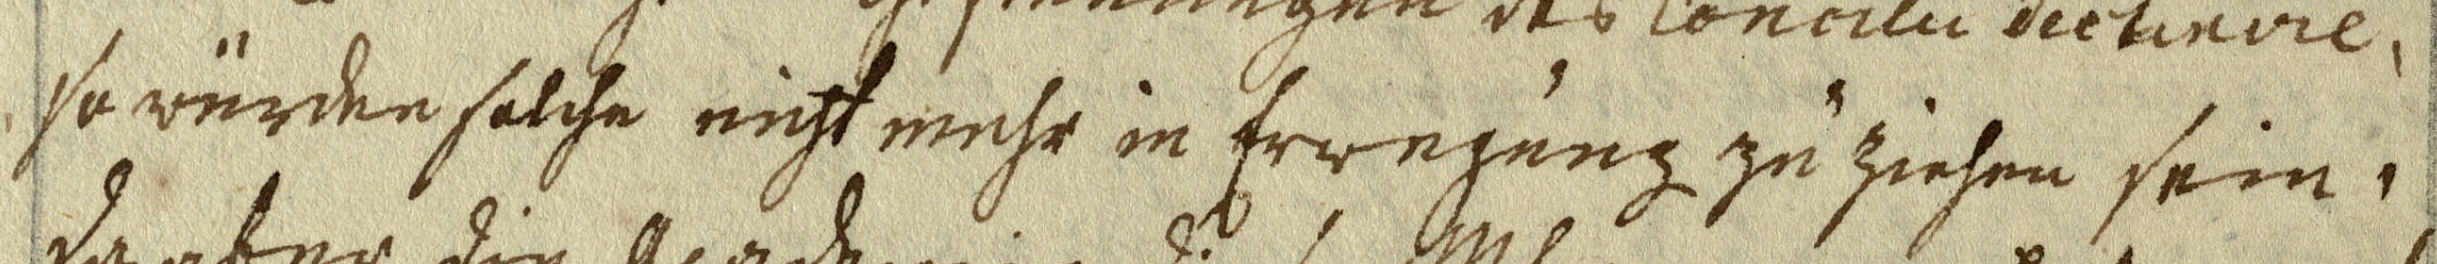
so würden solche nicht mehr in Erwegung zu ziehen sein,
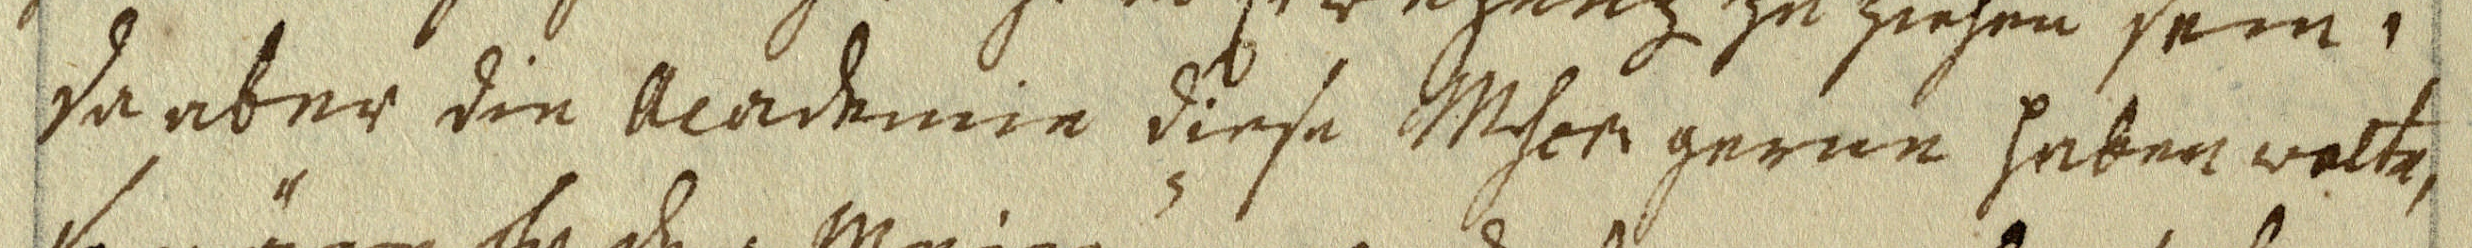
da aber die Academie Mscr. gerne haben wolte,
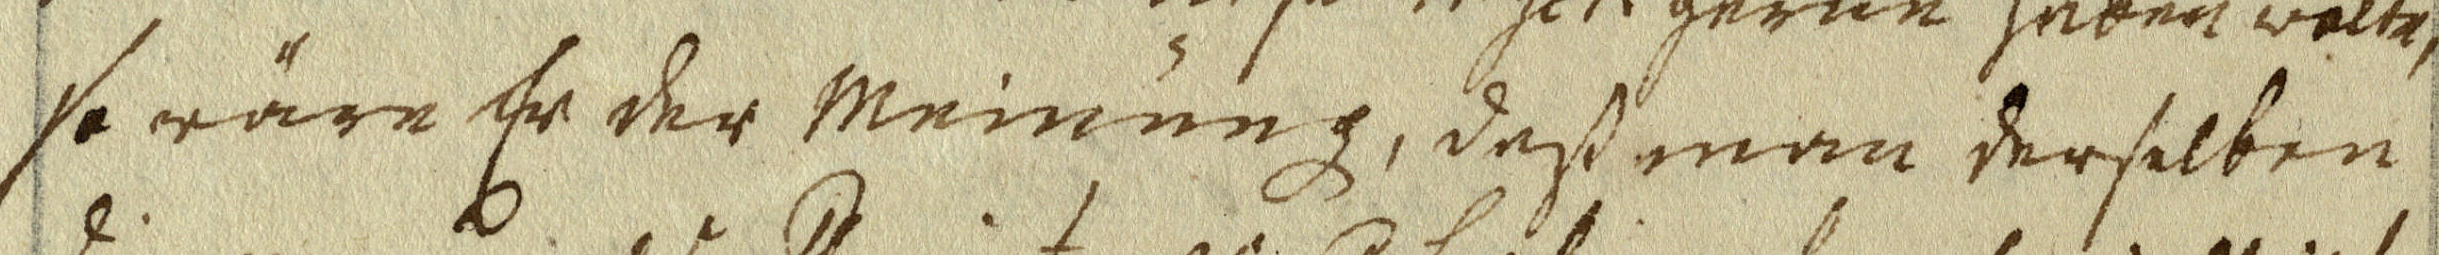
so wäre Er der Meinung, daß man derselben
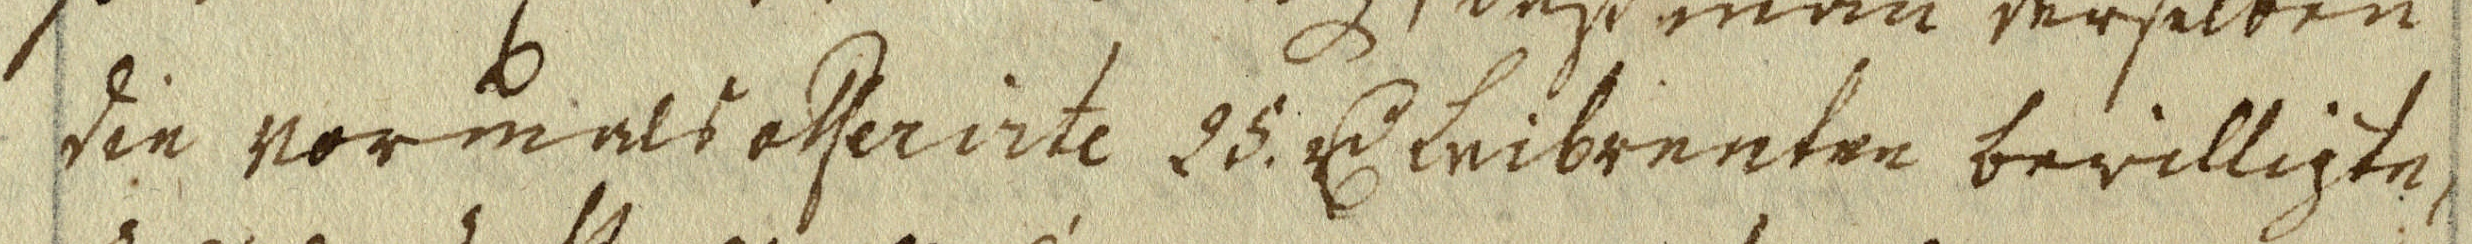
die vormals offerirte 25 rd. Leibrente bewilligte,
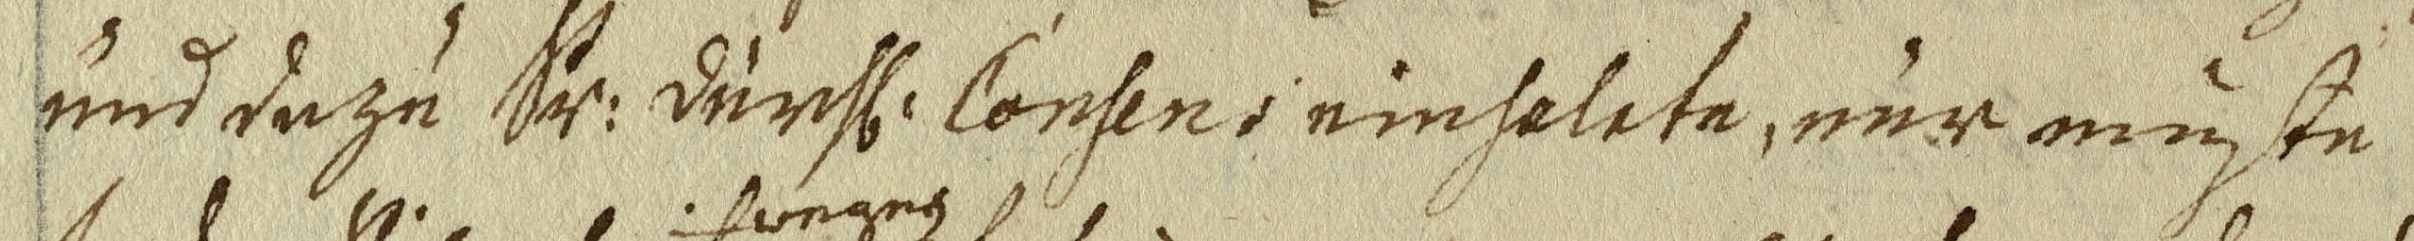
und dazu Sr. Durchl. Consens einholete, nur müste
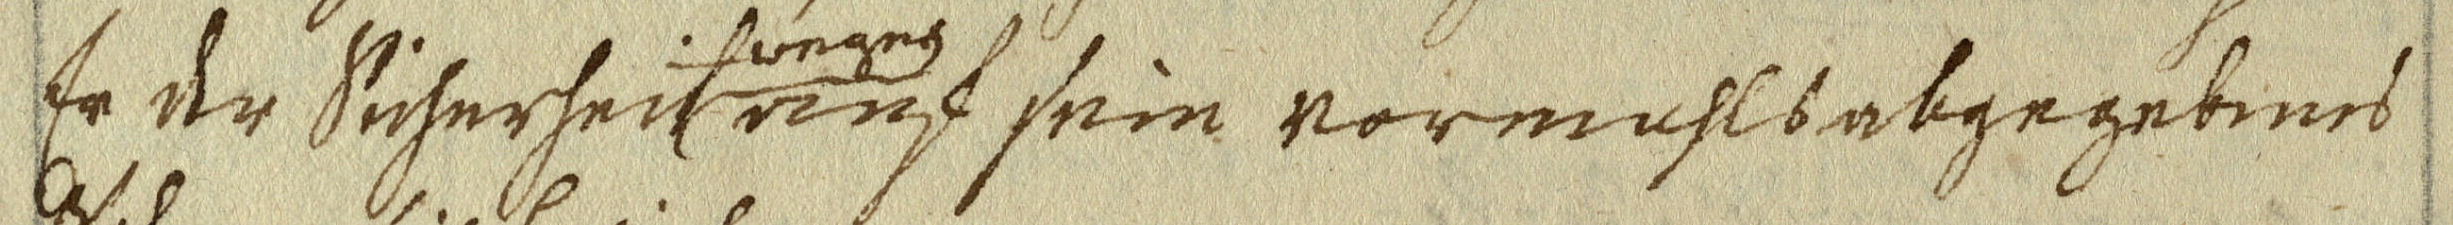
Er der Sicherheit wegen auf sein vormahls abgegebenes
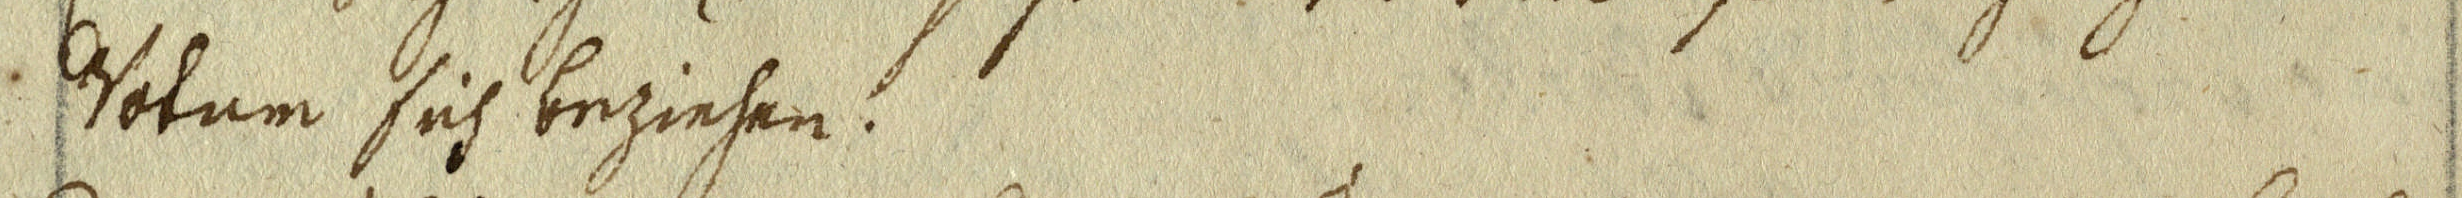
Votum sich beziehen.
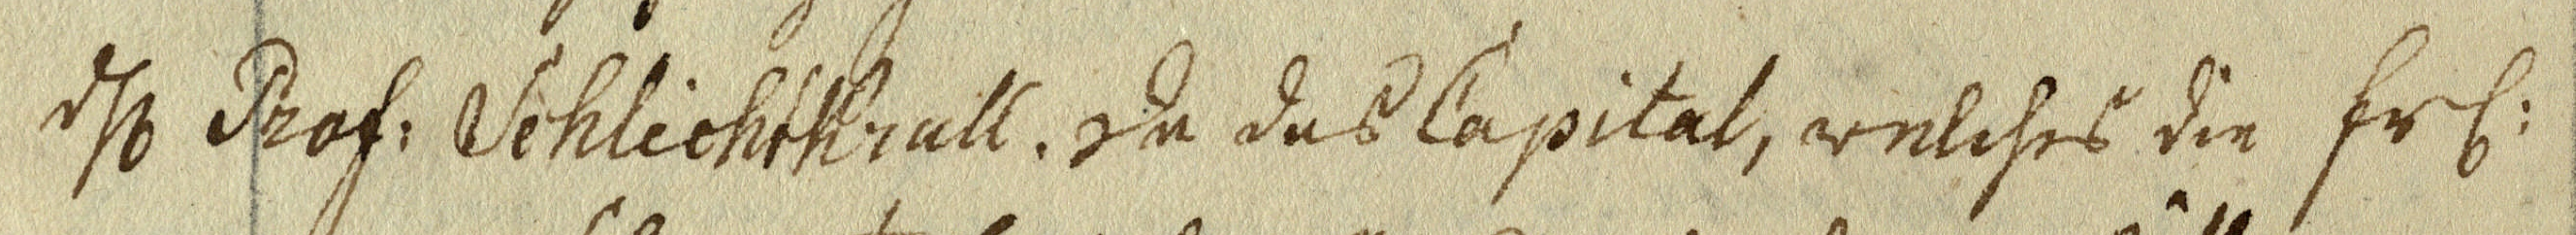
dh Prof. Schlichtkrull. Da das Capital, welches die Frl.
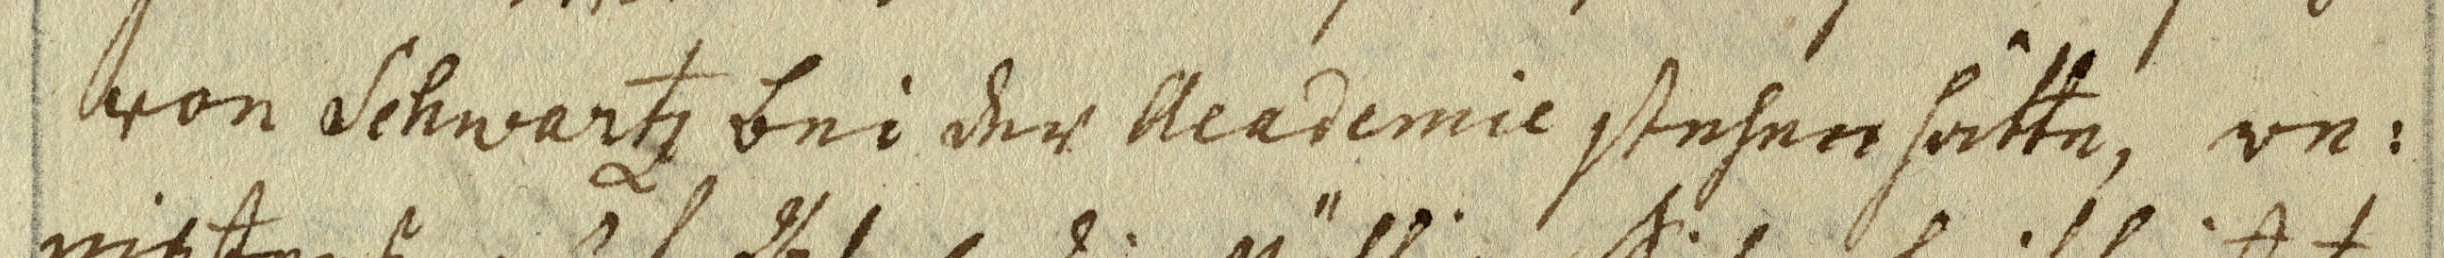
von Schwartz bei der Academie stehen hätte, we¬
